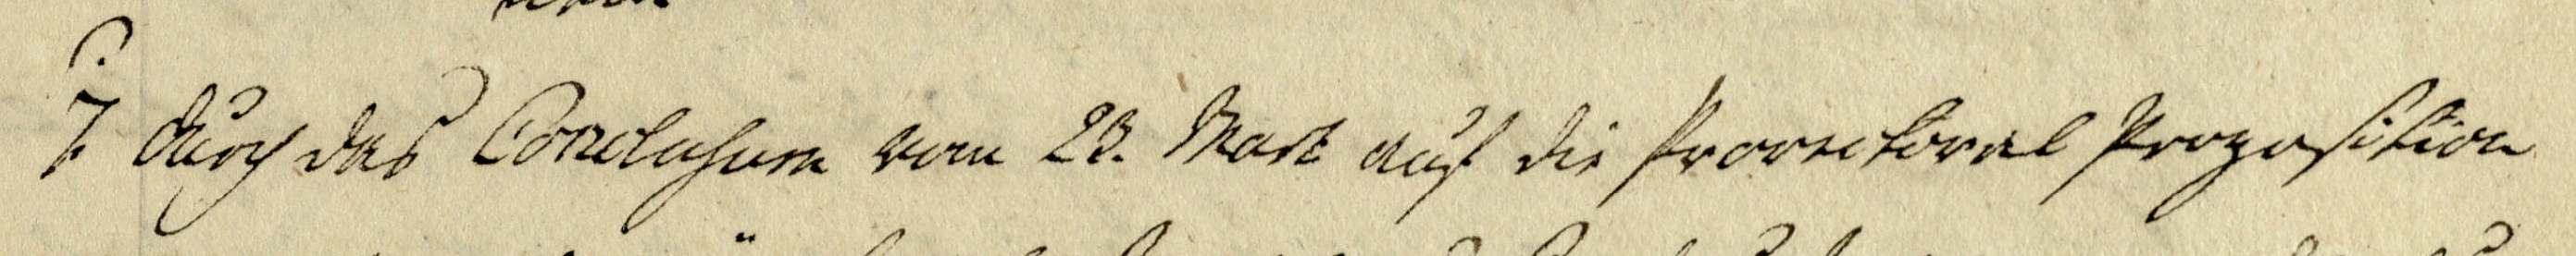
7. Durch das Conclusum vom 23. Mart auf die Prorectorat Proposition
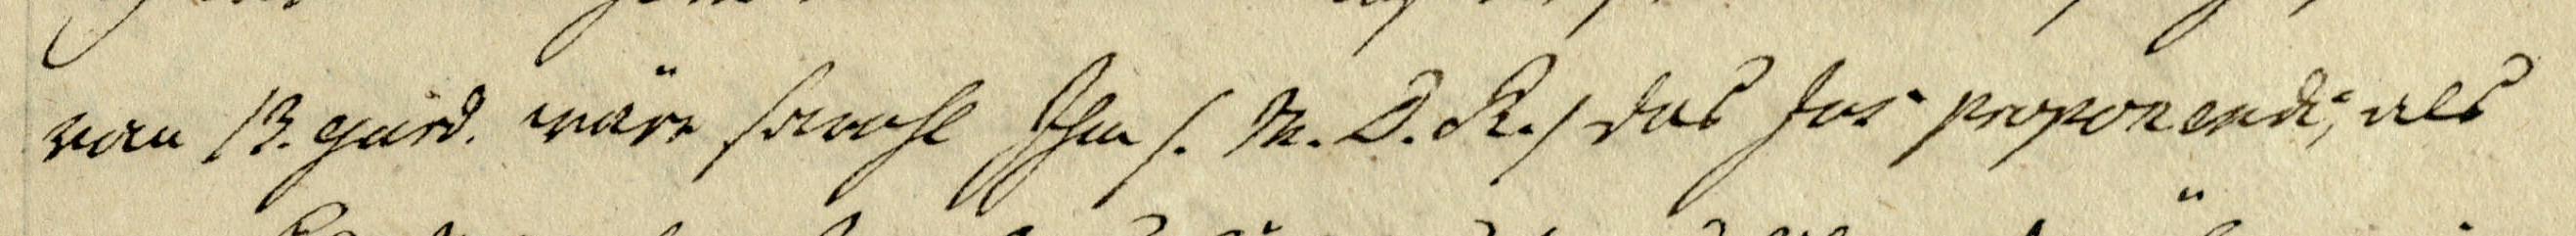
vom 13. ejusd. wäre sowohl Ihm /. M. D. R./ das Jus proponendi, als
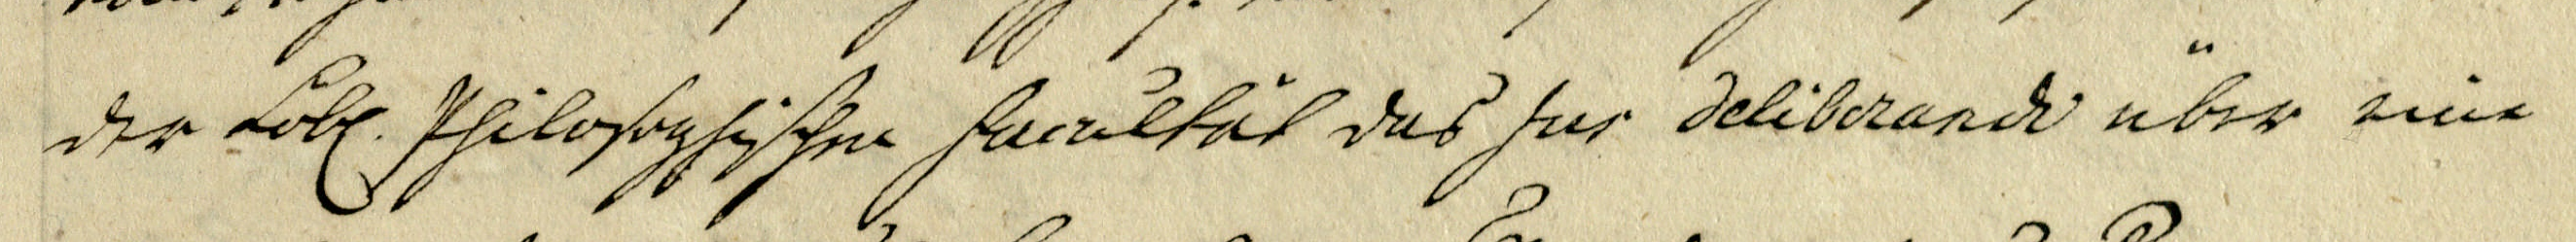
der Löbl. Philosophischen Facultät das Jus deliberandi über eine
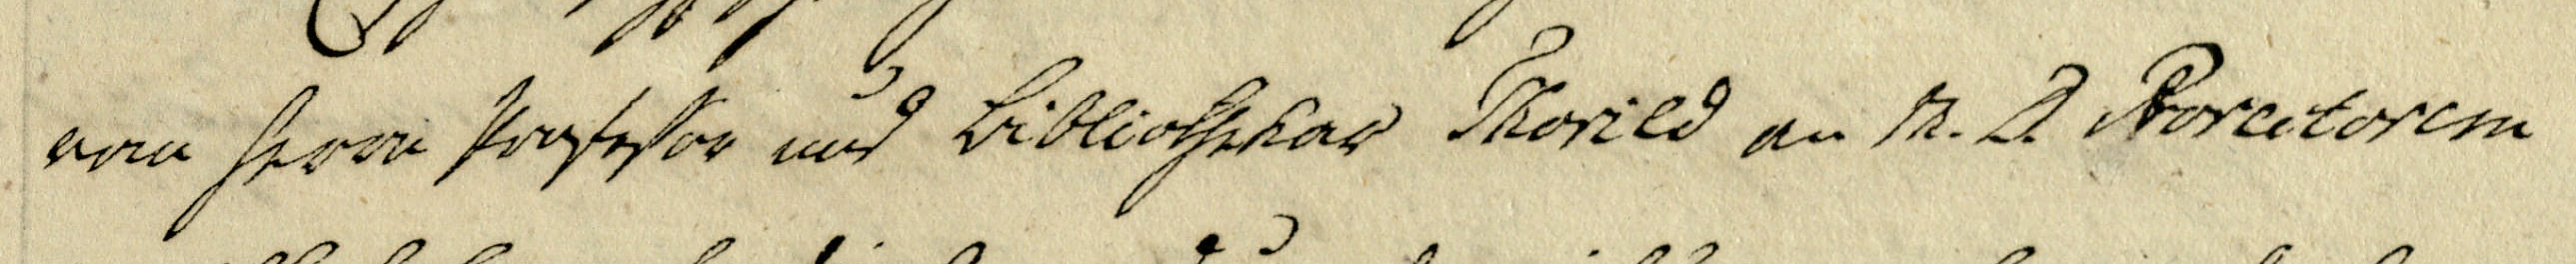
von Herrn Professor und Bibliothekar Thorild an M. D. Prorectorem
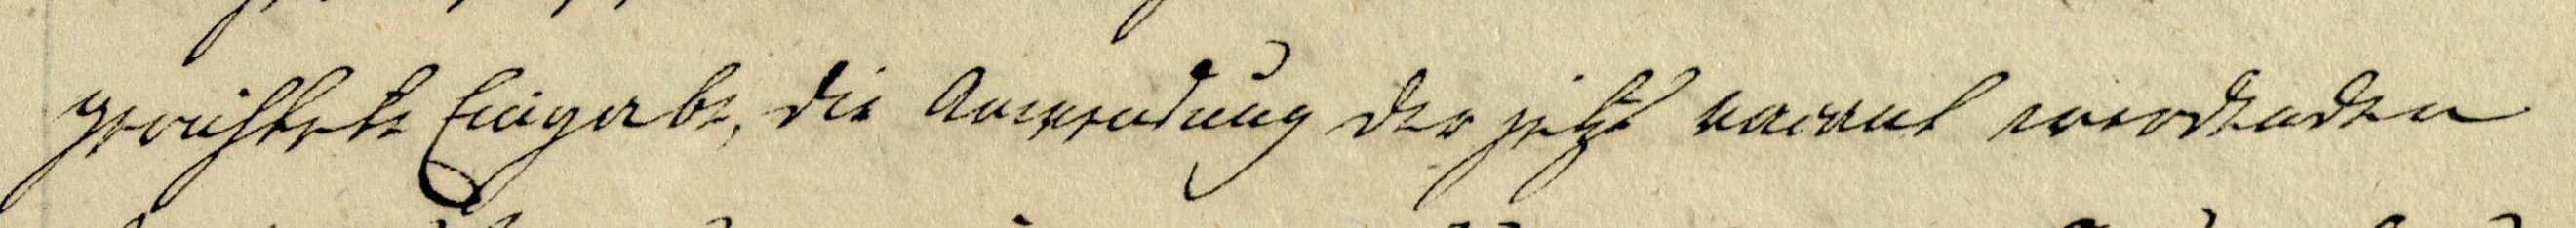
gerichtete Eingabe, die Anwendung der jetzt vacant werdenden
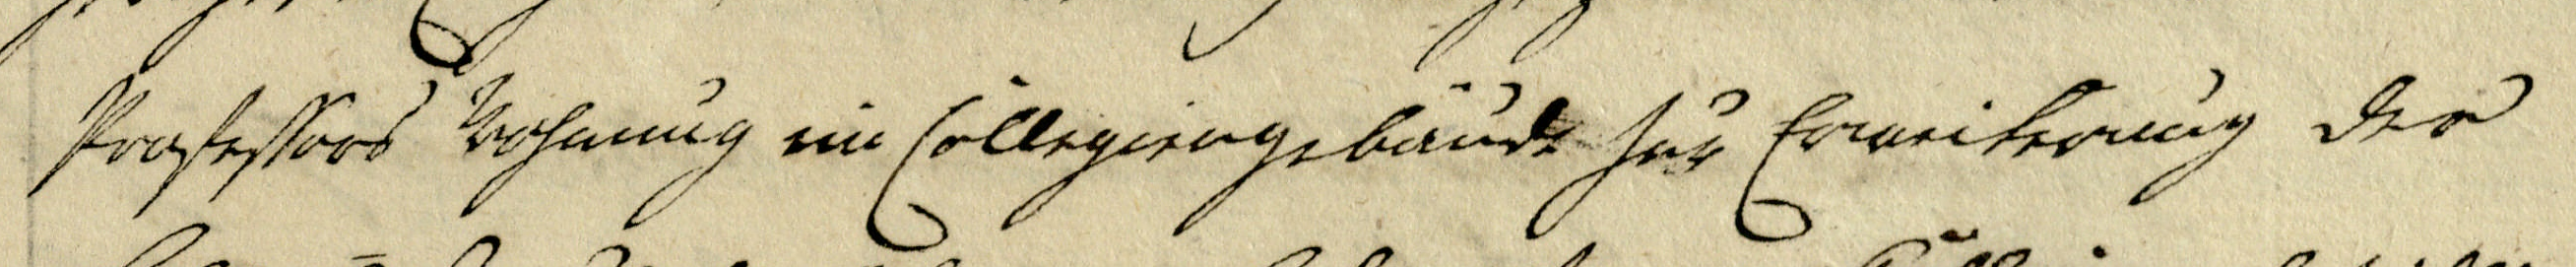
Professors Wohnung im Collegiengebäude zur Erweiterung der
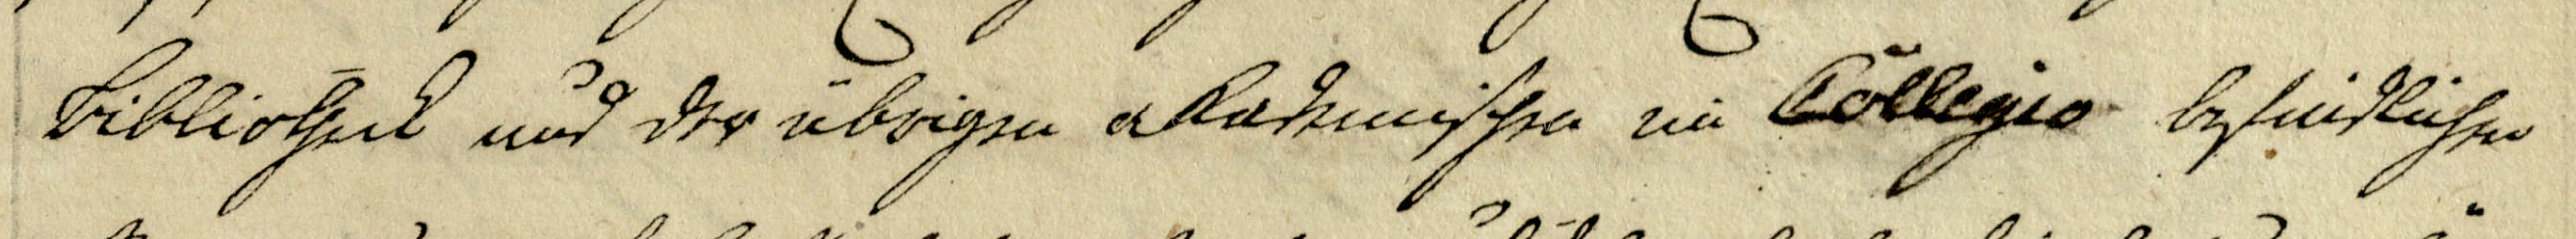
Bibliotheck und der übrigen akademischen im Collegio befindlichen
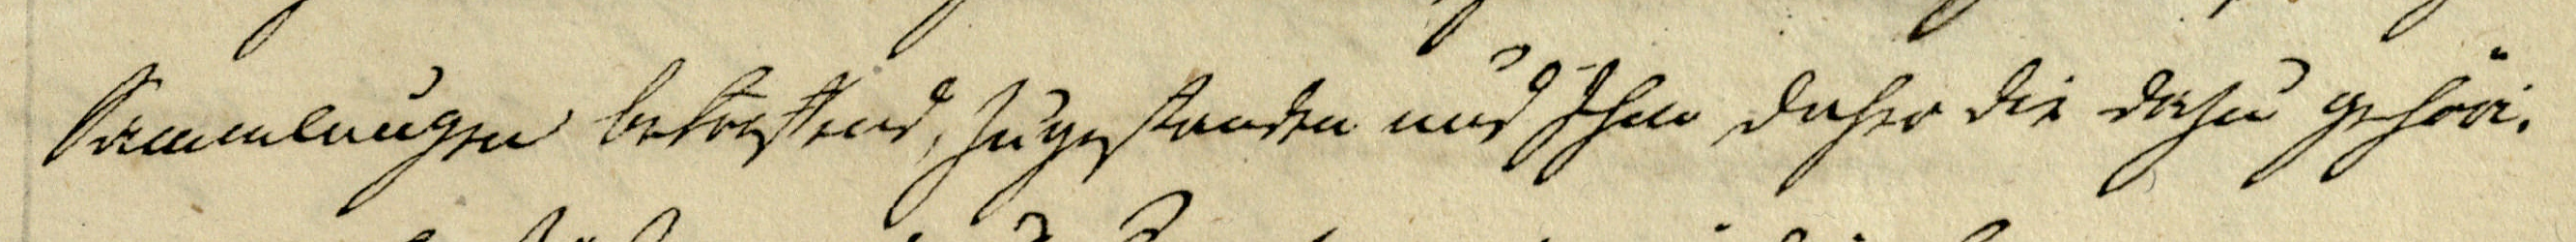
Sammlungen betreffend, zugestanden und Ihm daher die dazu gehöri¬
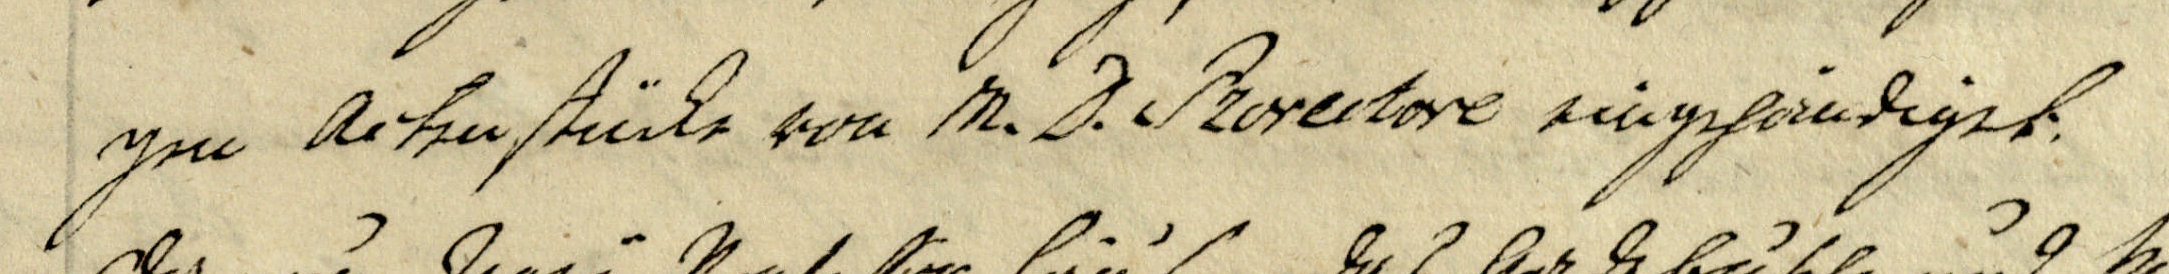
gen Actenstücke von M. D. Prorectore eingehändiget.
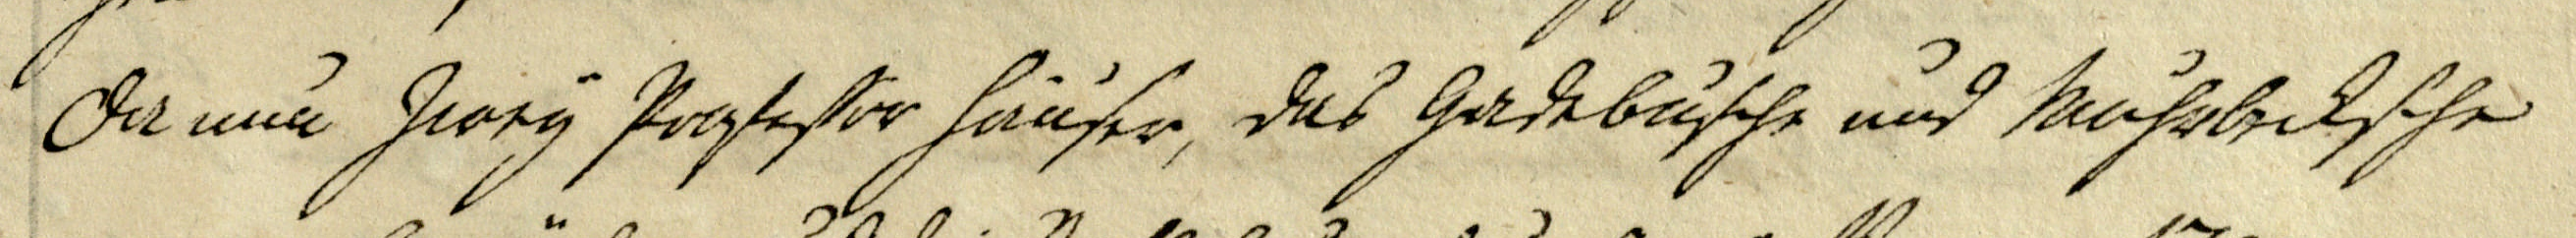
Da nun zweÿ Professor Häuser, das Gadebusche und Muhrbecksche
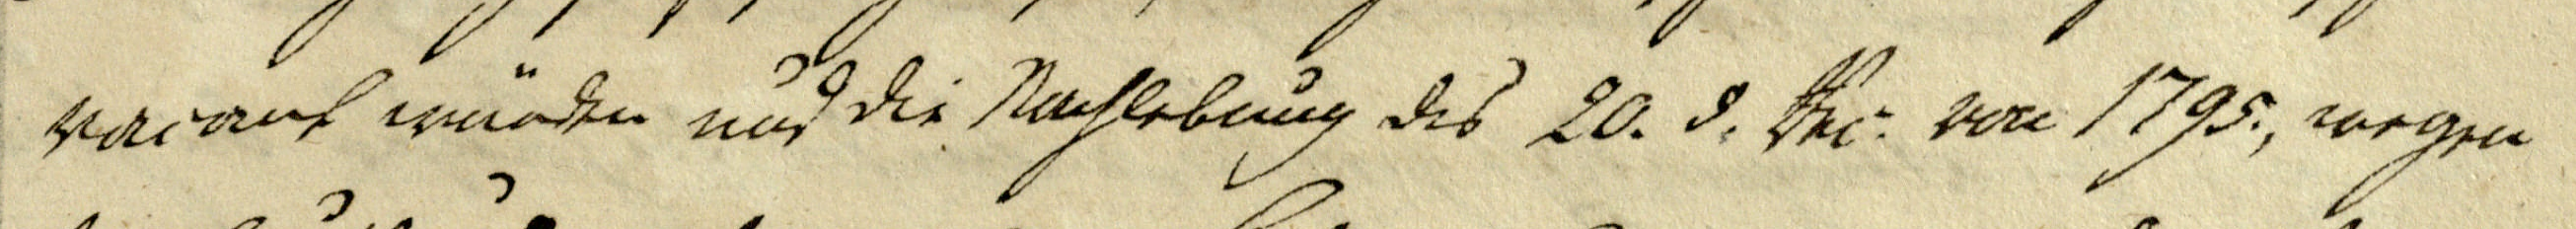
vacant würden und die Nachlebung des 20. §. Rec. von 1795., wegen
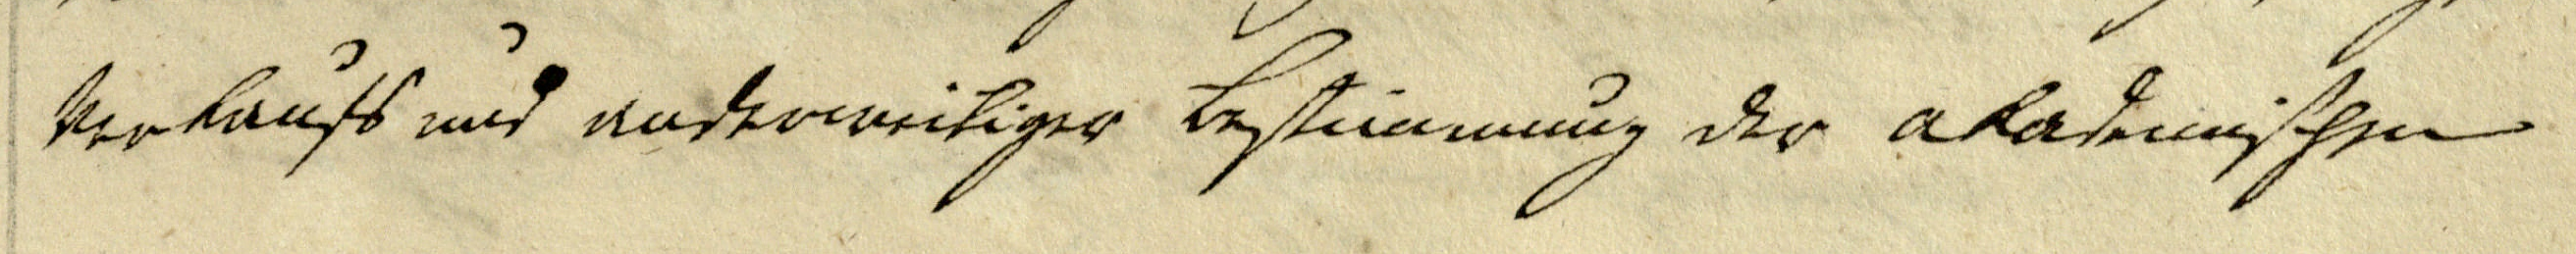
Verkaufs und anderweitiger Bestimmung der akademischen
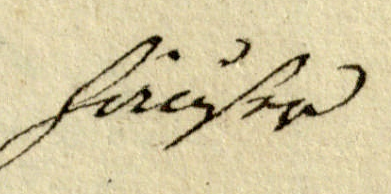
Häuser
